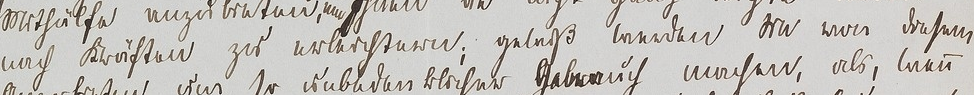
nach Kräften zu erleichtern; gewiß werden Sie von diesem
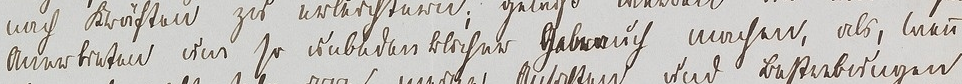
Anerbieten um so unbedenklicher Gebrauch machen, als, wenn
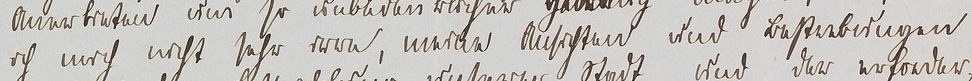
ich mich nicht sehr irre, meine Ansichten und Bestrebungen
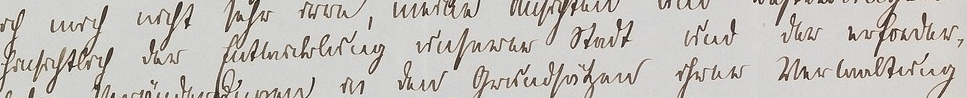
hinsichtlich der Entwicklung unserer Stadt und der erforder-
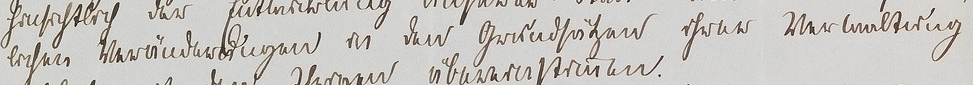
lichen Veränderungen in den Grundsätzen ihrer Verwaltung
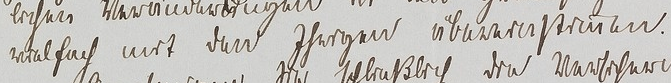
vielfach mit den Ihrigen übereinstimmen.
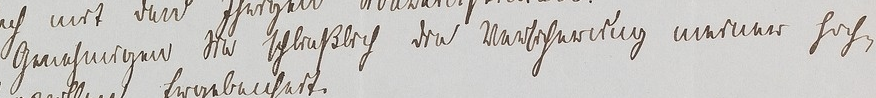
Genehmigen Sie schließlich die Versicherung meiner hoch-
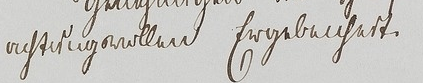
achtungsvollen Ergebenheit.
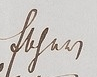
Escher
